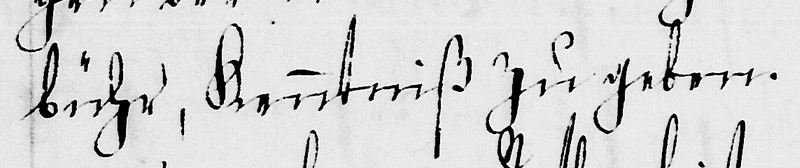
bühr, Kenntniß zu geben.
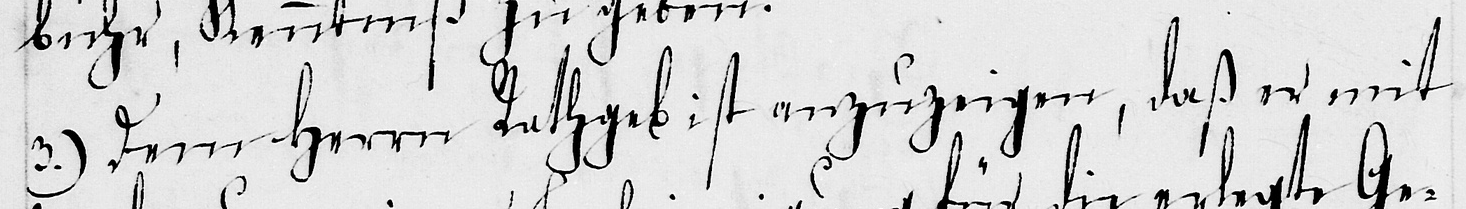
3.) Dem Herrn Rathgeb ist anzuzeigen, daß er mit
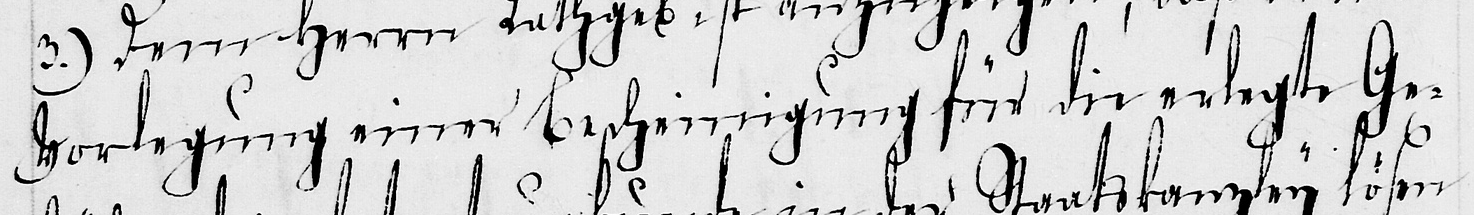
Vorlegung einer Bescheinigung für die erlegte Ge¬
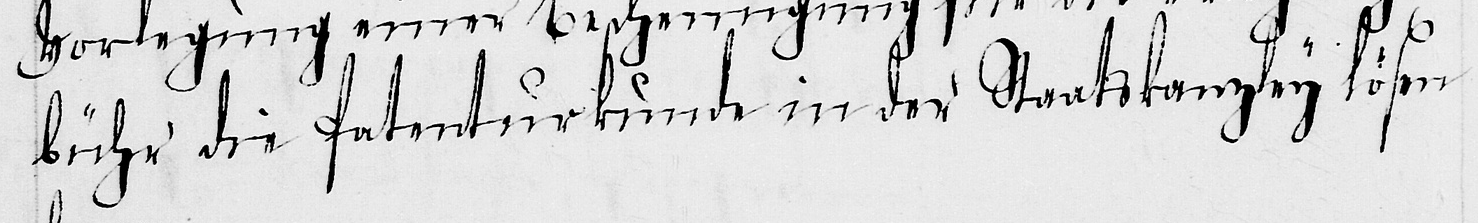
bühr die Patenturkunde in der Staatskanzley lösen
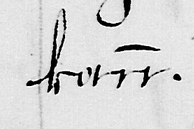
kann.
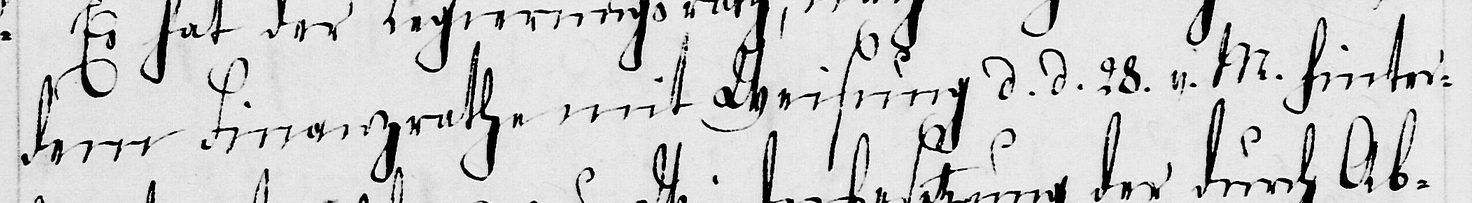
dem Finanzrathe mit Weisung d. d. 28. v. M. hinter¬
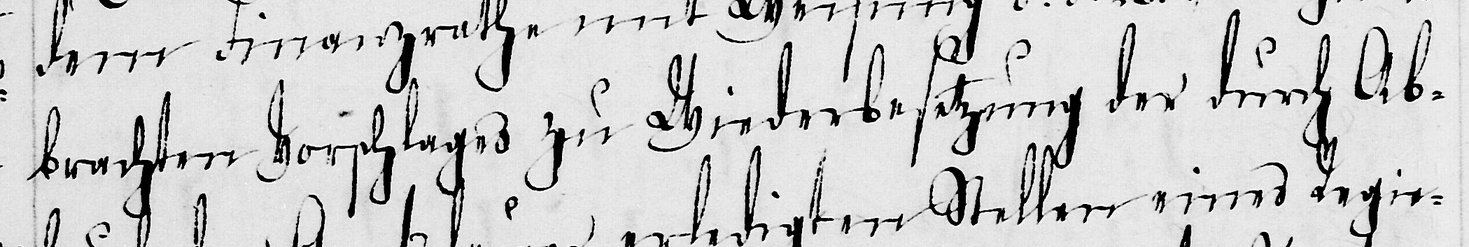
brachten Vorschlages zu Wiederbesetzung der durch Ab¬
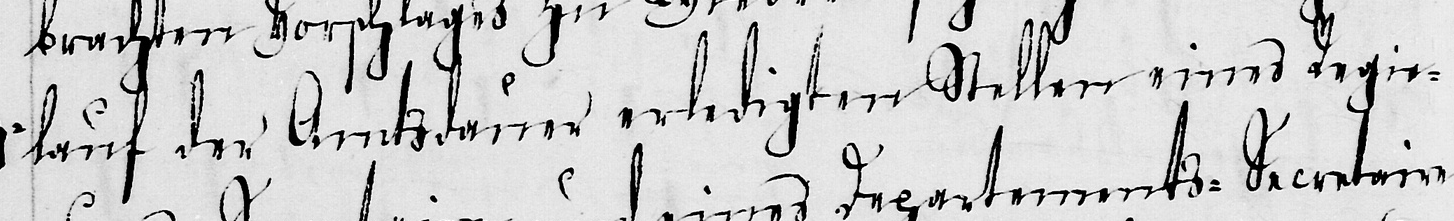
lauf der Amtsdauer erledigten Stellen eines Regie¬
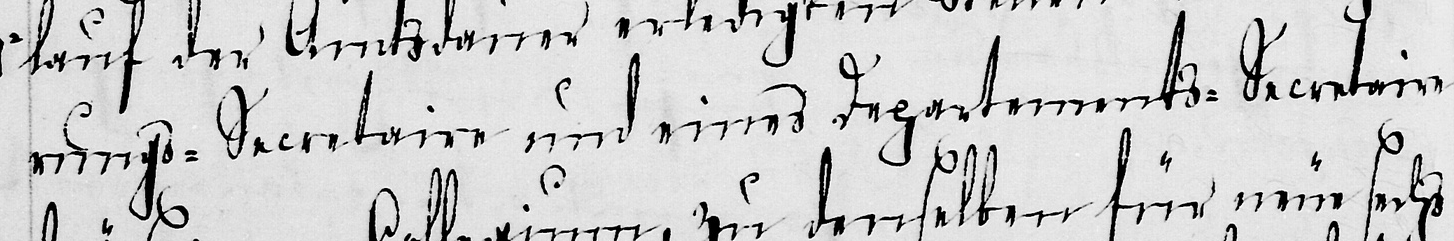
rungs-Secretaire und eines Departements-Secretaire
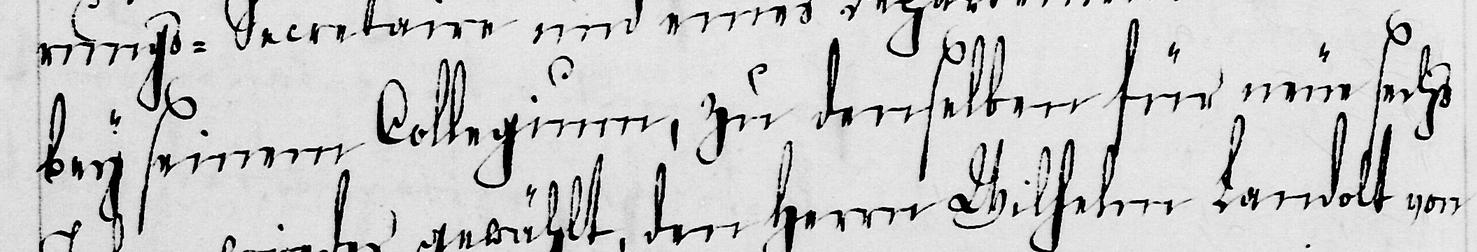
bey seinem Collegium, zu denselben für neue sechs
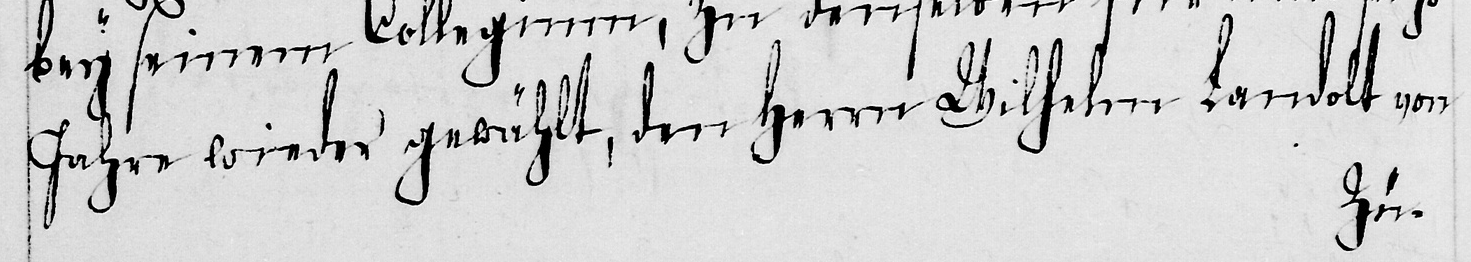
Jahre wieder gewählt, den Herrn Wilhelm Landolt von
